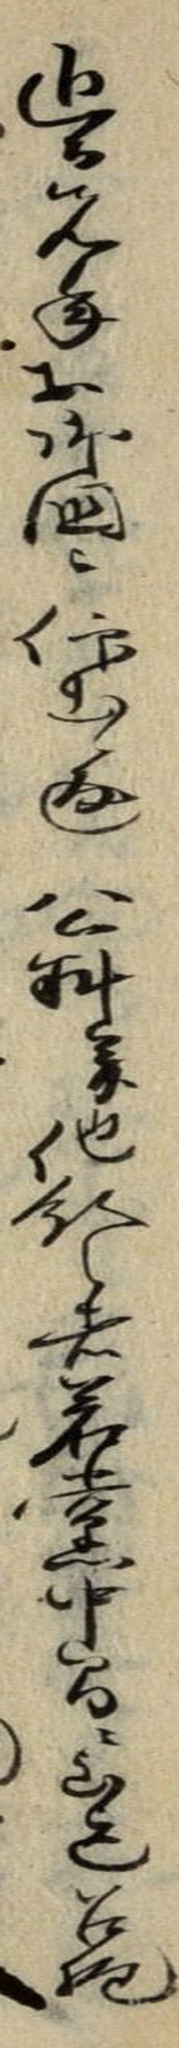追て先年於御国被仰出候通公料并他領之者若党中間に至迄召抱
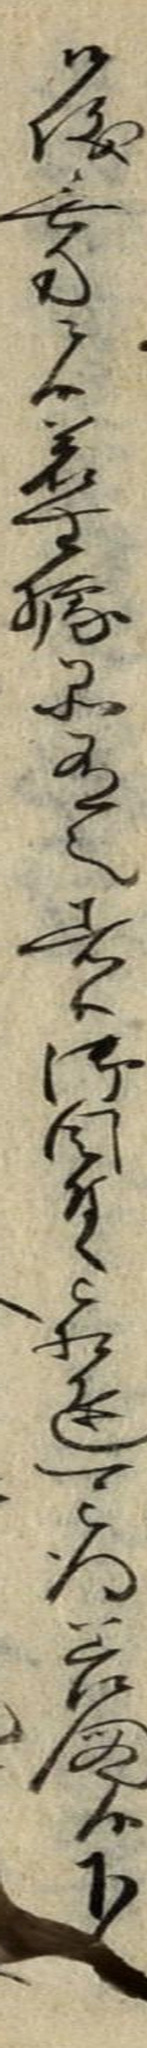候儀無用に候若無據品有之者は御目付へ被相達可被得差図候下
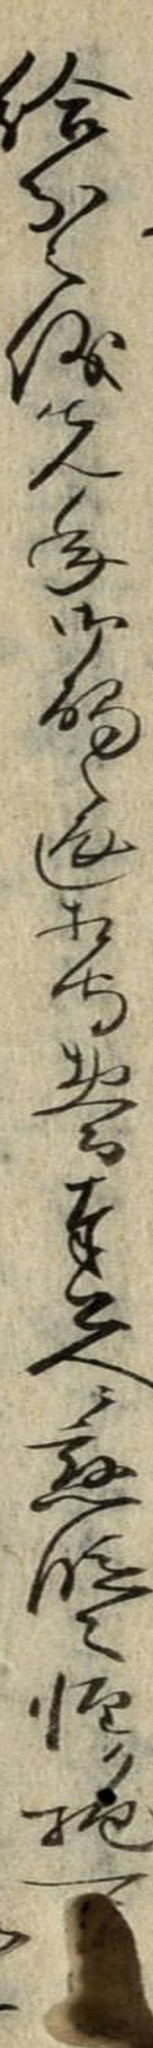給分之儀先年御触之通相守惣て奉公人に応段々軽く抱可
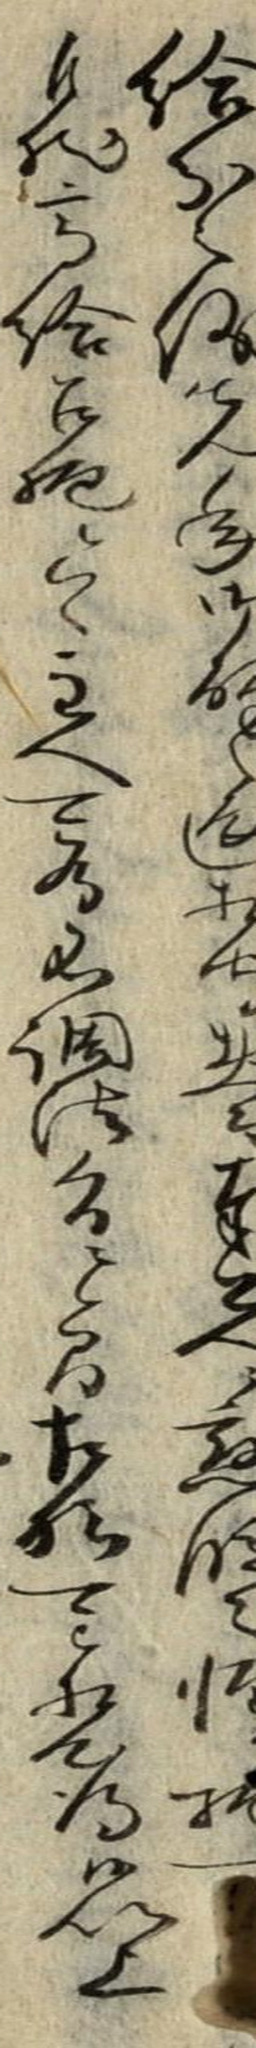自然高給召抱候はゝ主人可為無調法旨に候間左様可被相心得候以上
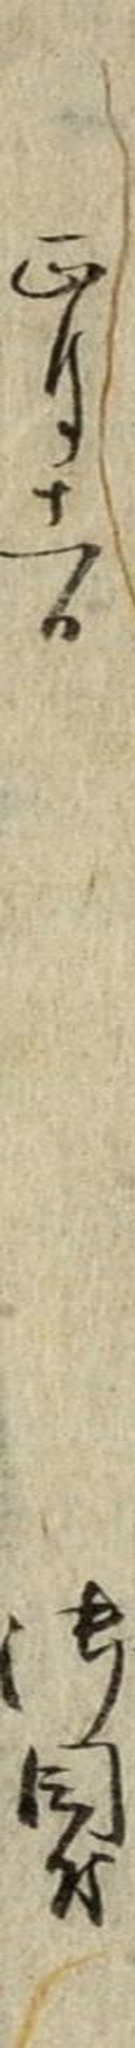正月十一日御目付
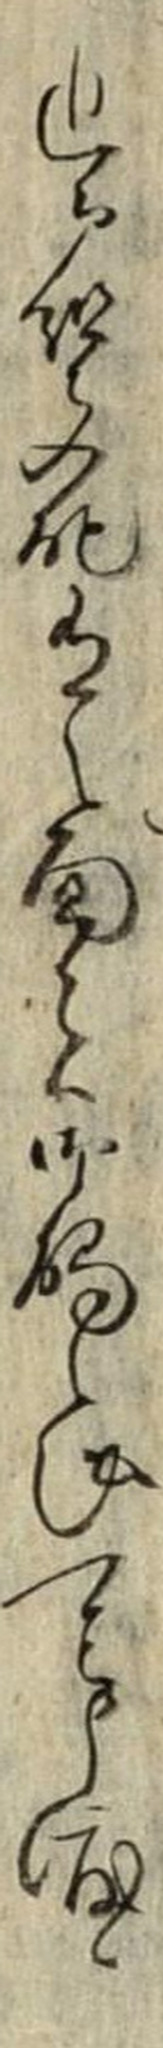追手組支配有之面々は御触之趣可被申渡候
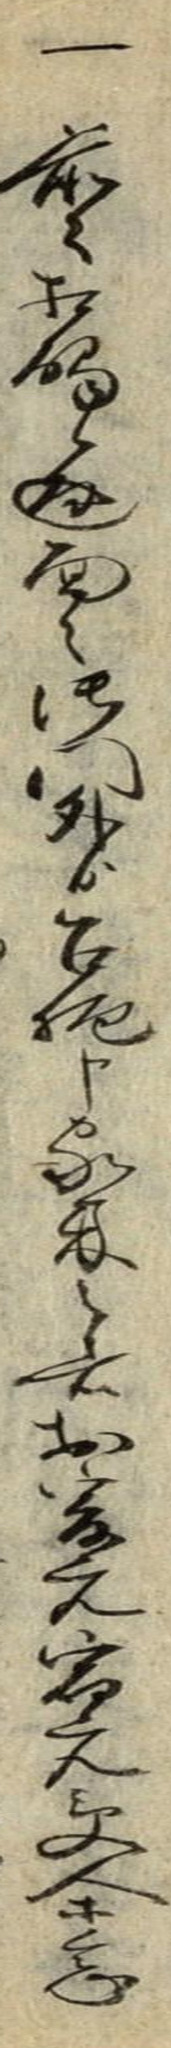一前々相触候通面々御門外ゟ召抱申家来之者於爰元宿元受人等念
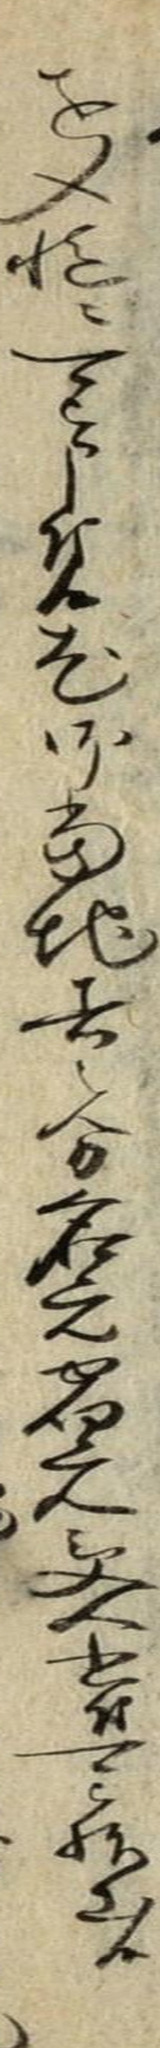を入慥に可被申付候尤御当地者之分名元宿元受人書付可被指出候
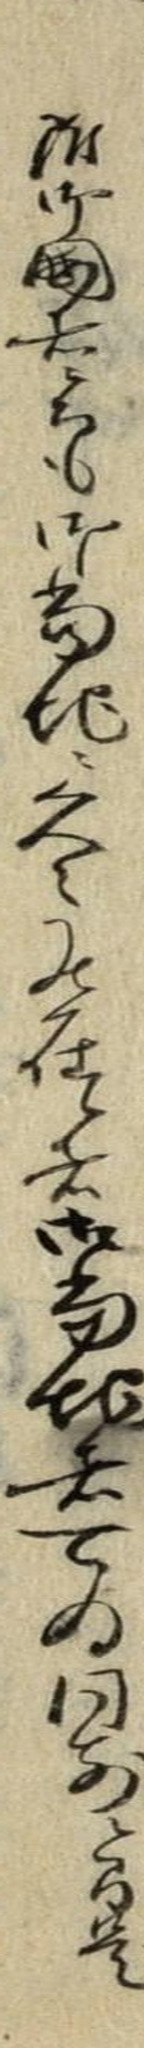附御国者にても御当地に久々罷在候者御当地者可為同前候間是
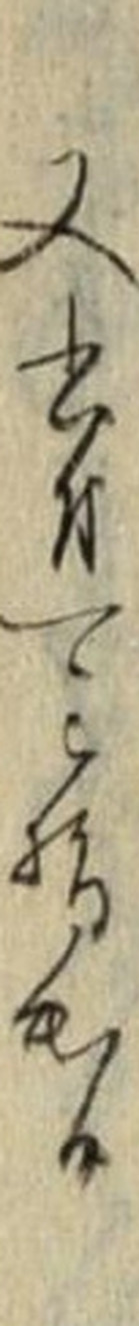又書付可被指出候
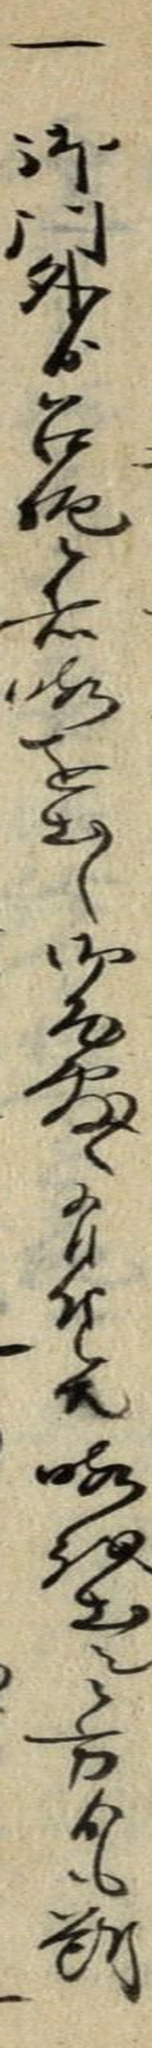一御門外ゟ召抱候者暇を出し御屋敷へ有付候共暇を出し候方ゟも断
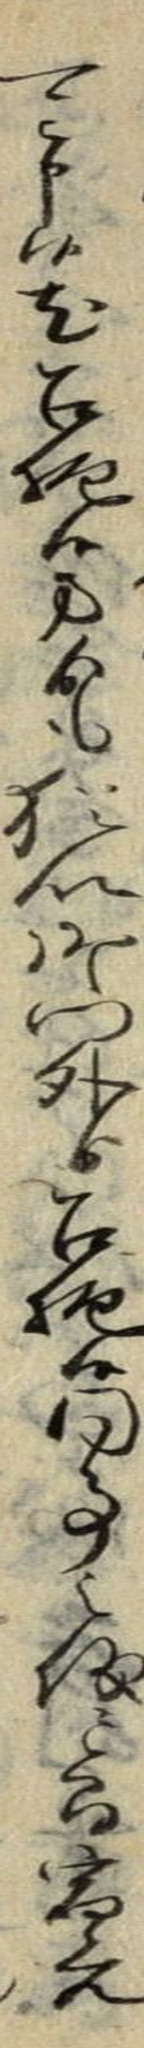可被申候尤召抱候方ゟも猶以御門外ゟ召抱候同事之儀に候間宿元
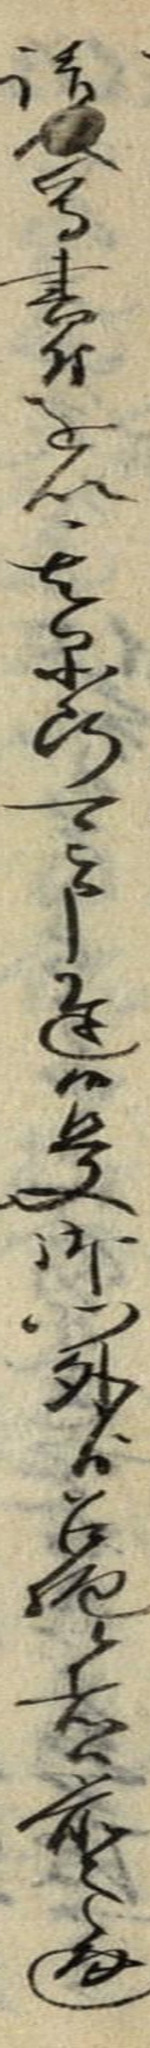請人等書付を以其品断可被申達候且又御門外ゟ召抱候者は前々之通
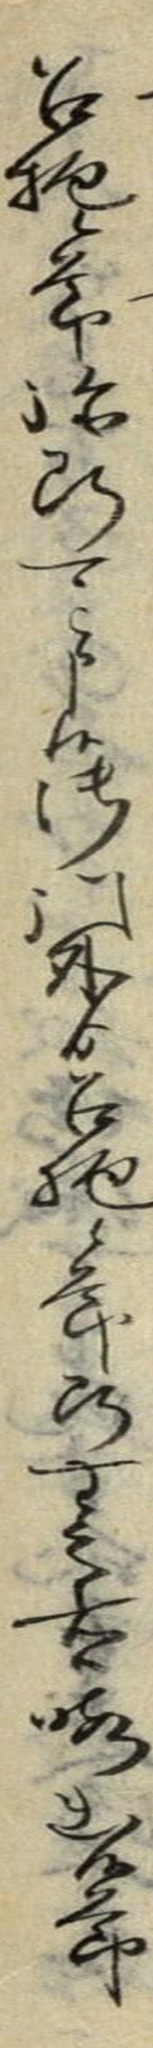召抱候節弥断可被申候御門外ゟ召抱候節断無之者は暇出候節
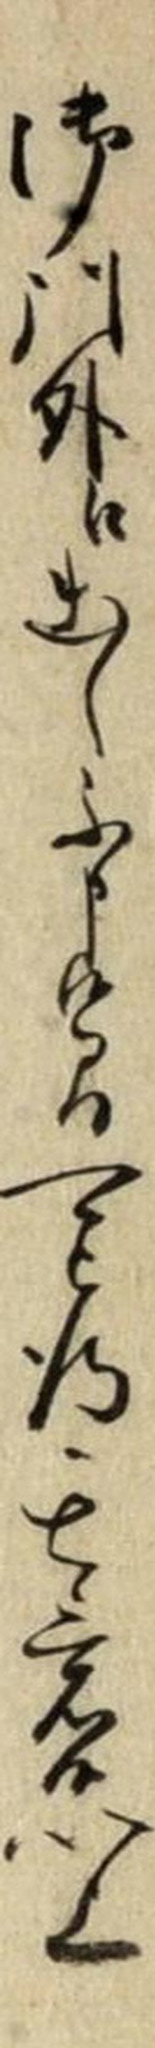御門外へ出し不申候間可被得其意候以上
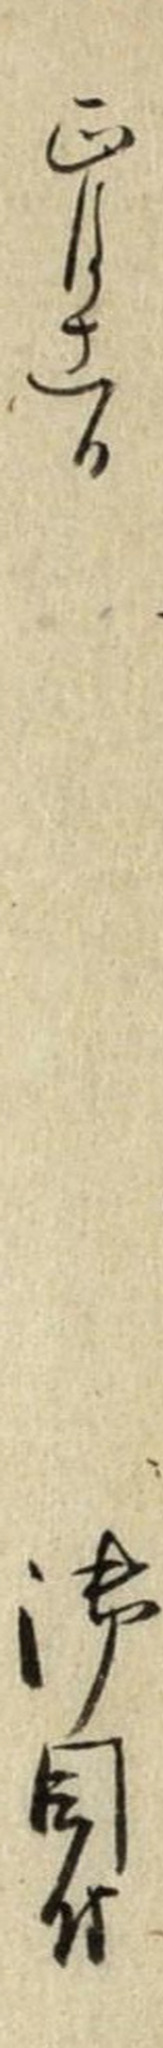正月十一日御目付
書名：三都并道中之部
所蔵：福井県文書館 Fukui Prefectural Archives
